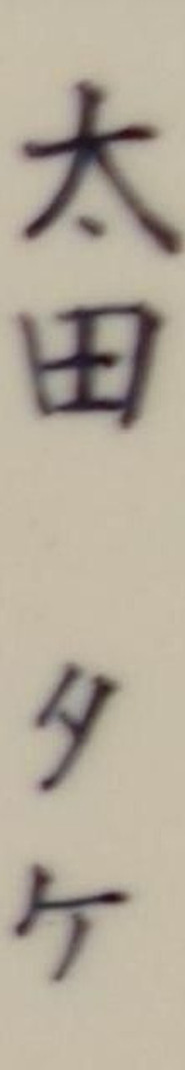太田タケ
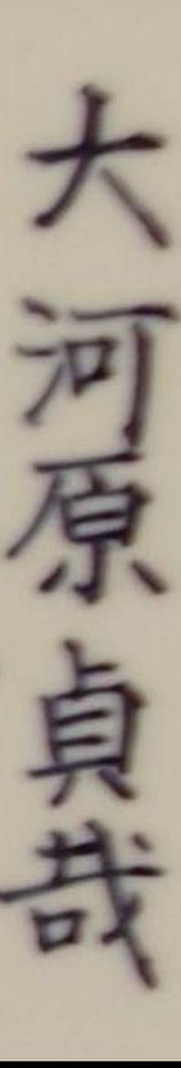大河原貞哉
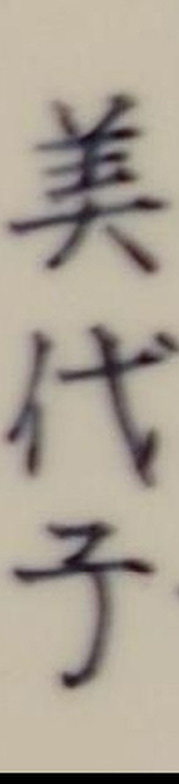美代子
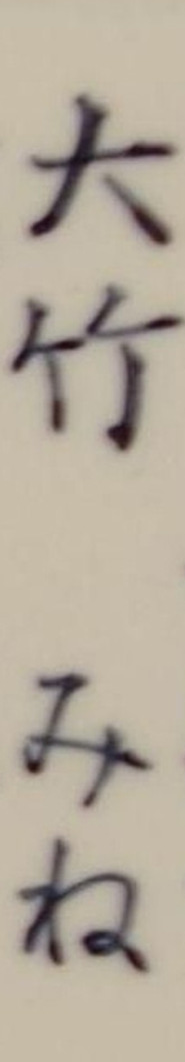大竹みね
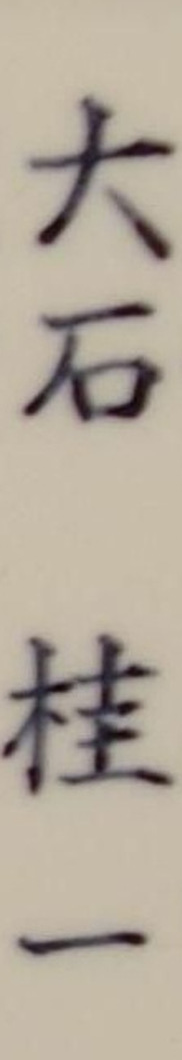大石桂一
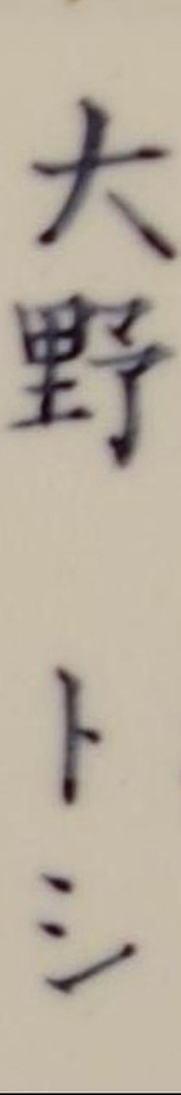大野トシ
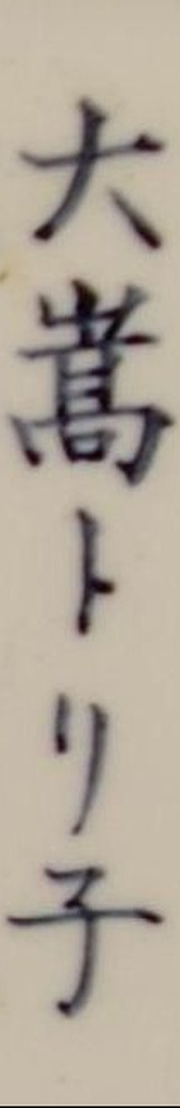大嵩トリ子
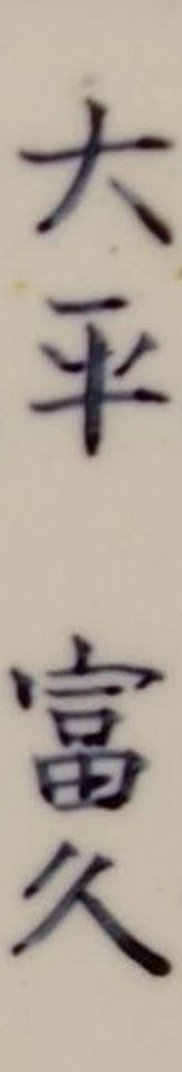大平富久
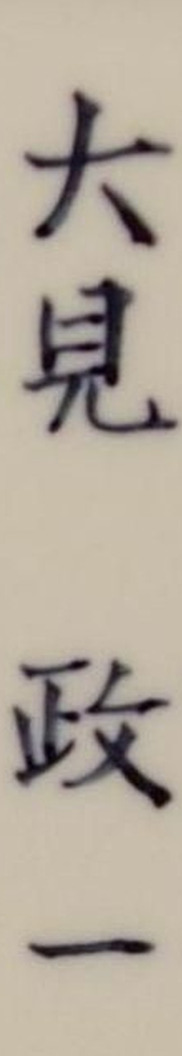大見政一
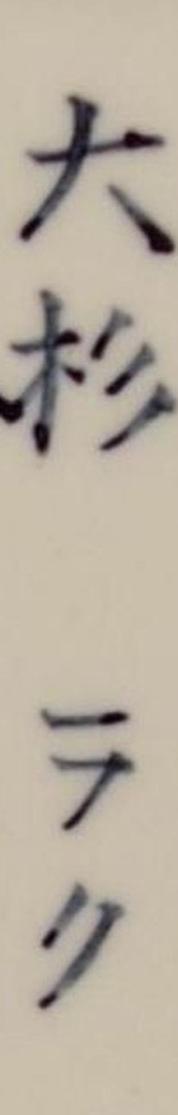大杉ラク
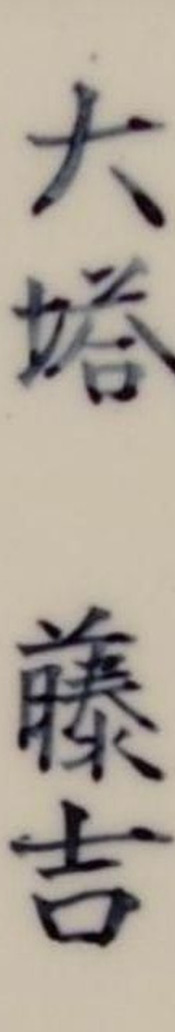大塔藤吉
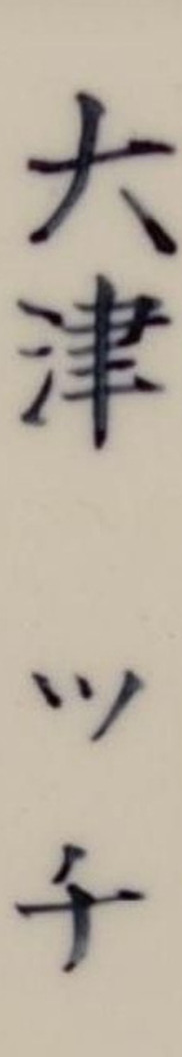大津ツチ
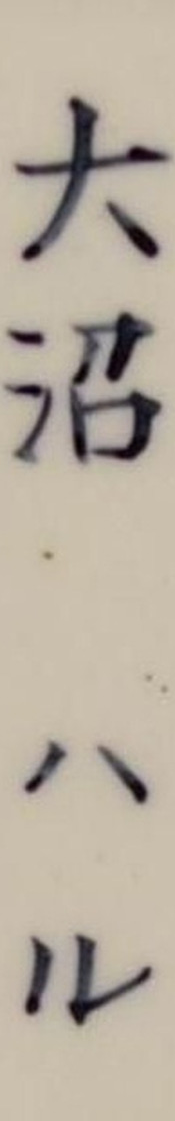大沼ハル
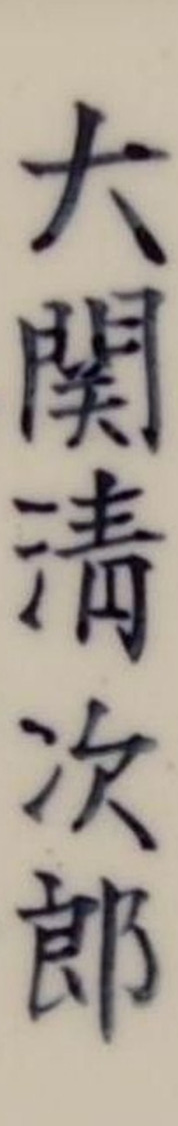大関清次郎
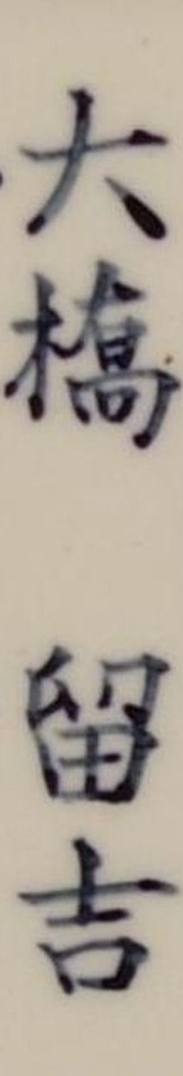大橋留吉
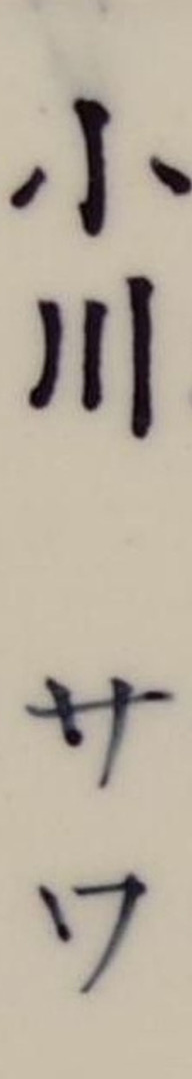小川サワ
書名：M~S
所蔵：高野山金剛峯寺
